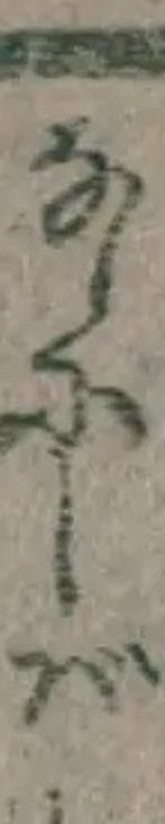なしにしば
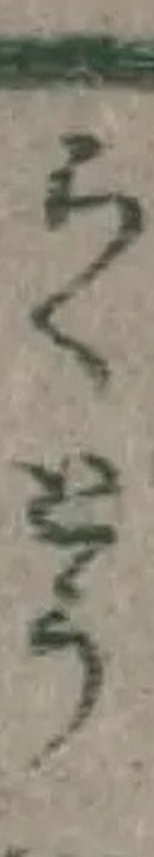らくとう
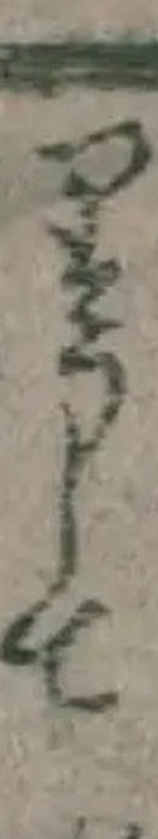りうして
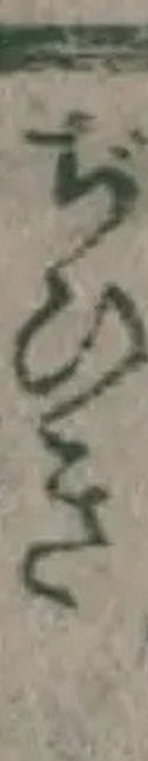ぢひき
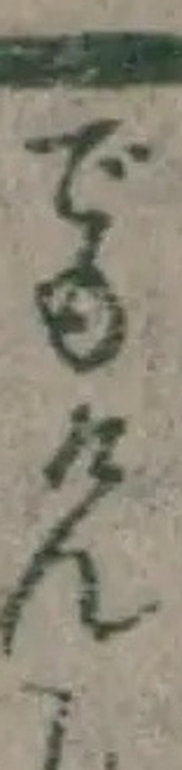でもけん
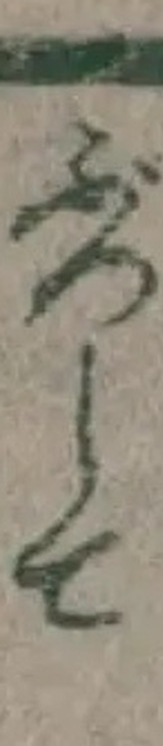ぶつして
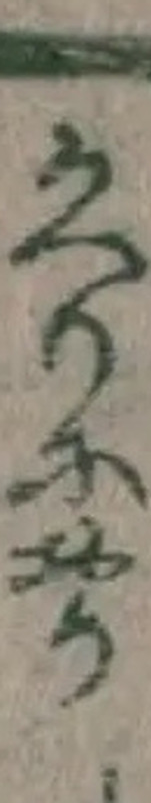かへりにおり
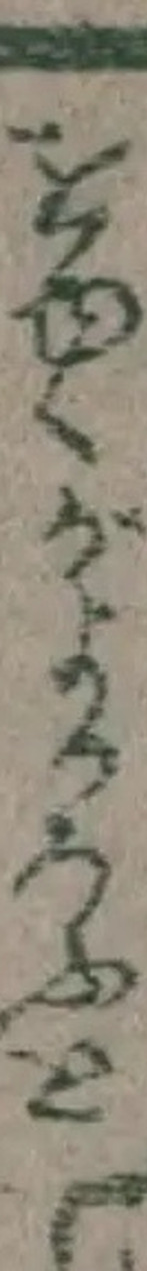をゆくがよかろふと
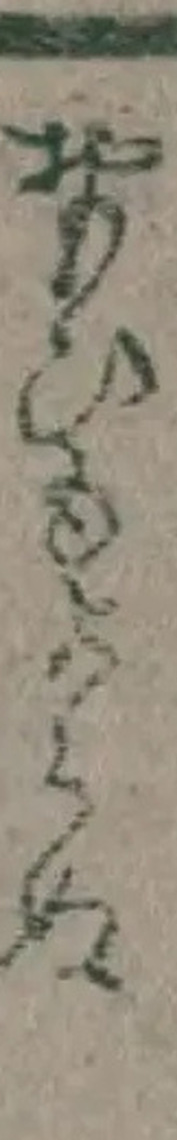おもひもよらぬ
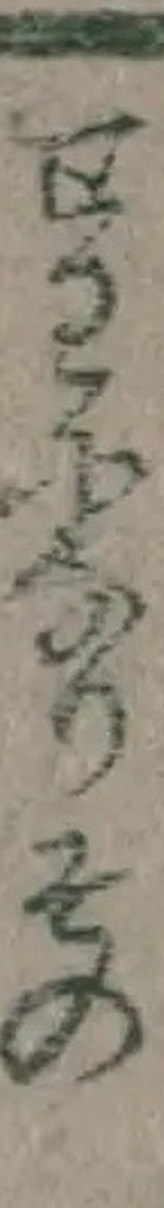せわになりその
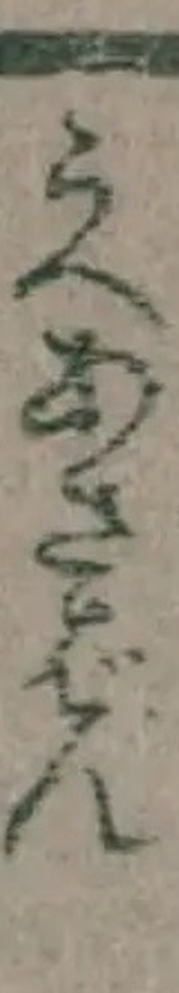うへあさばん
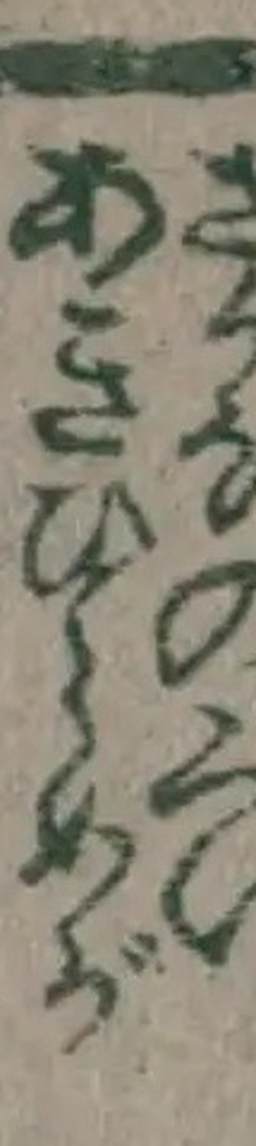あきひらめが
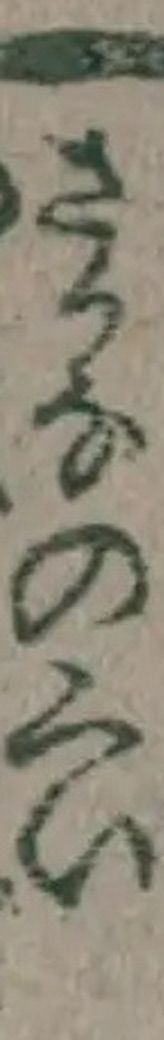さかなのくい
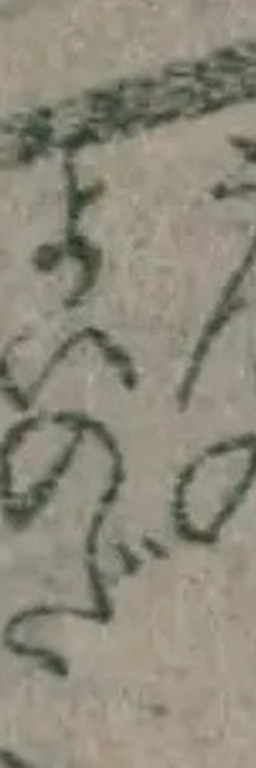よいのだ
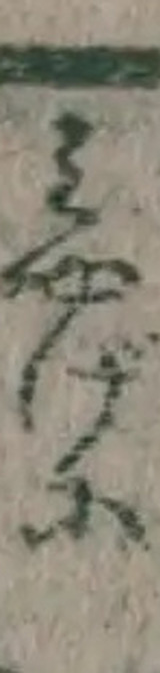みやげに
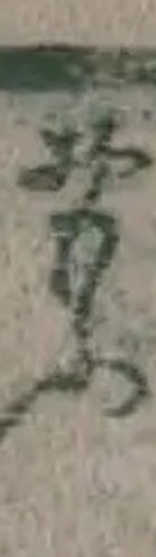おもふ
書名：縦筒放唐の噺 3巻
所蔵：国立国会図書館 National Diet Library, JAPAN
